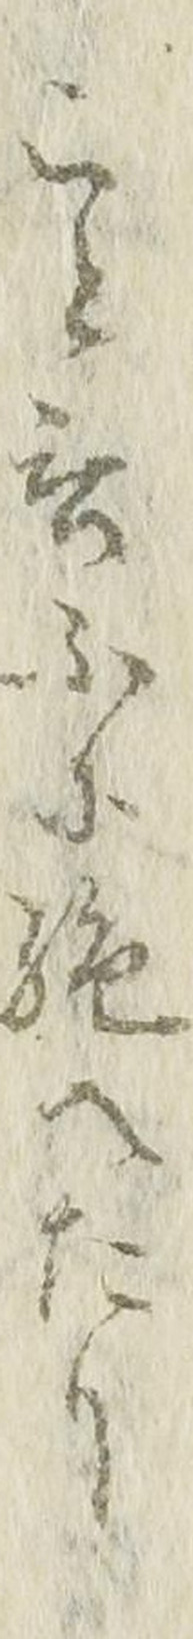こと云ふに絶へたり
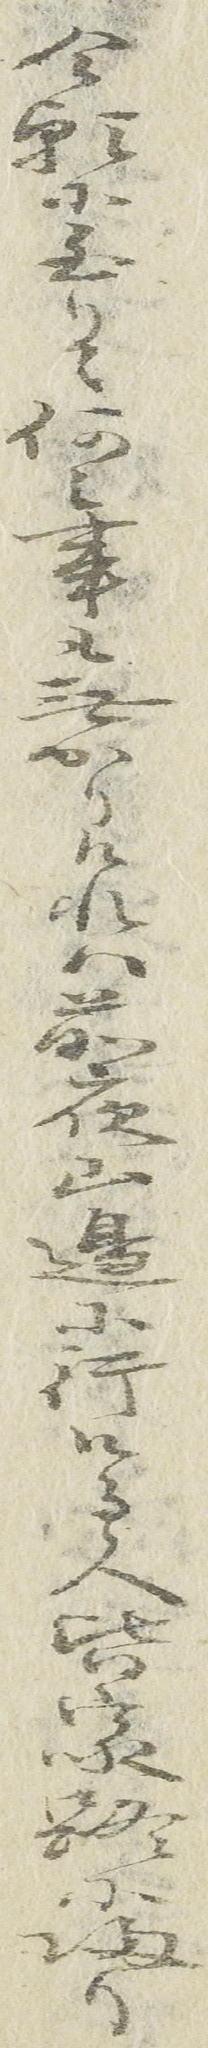今朝に至りて何之事も無かりけれは前夜山辺に行ける人皆家路に帰り

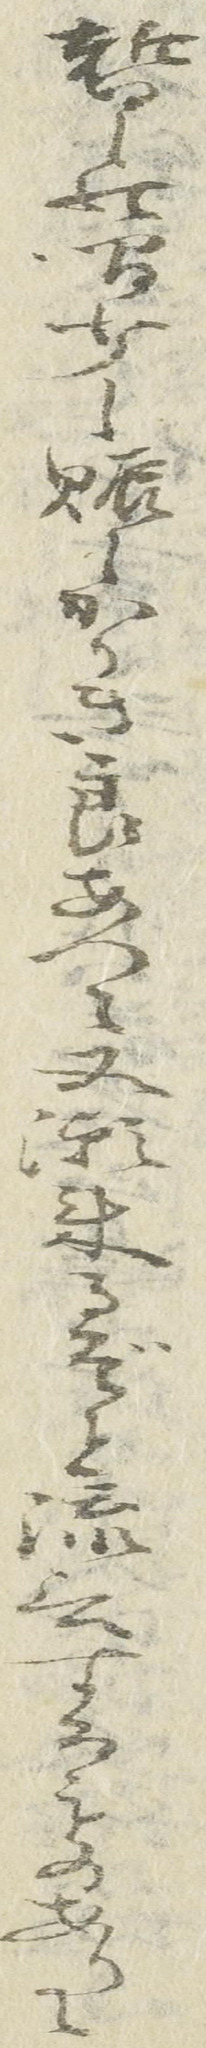暫しの間少し賑しかりき良あつて又潮来るぞと流言するものありて
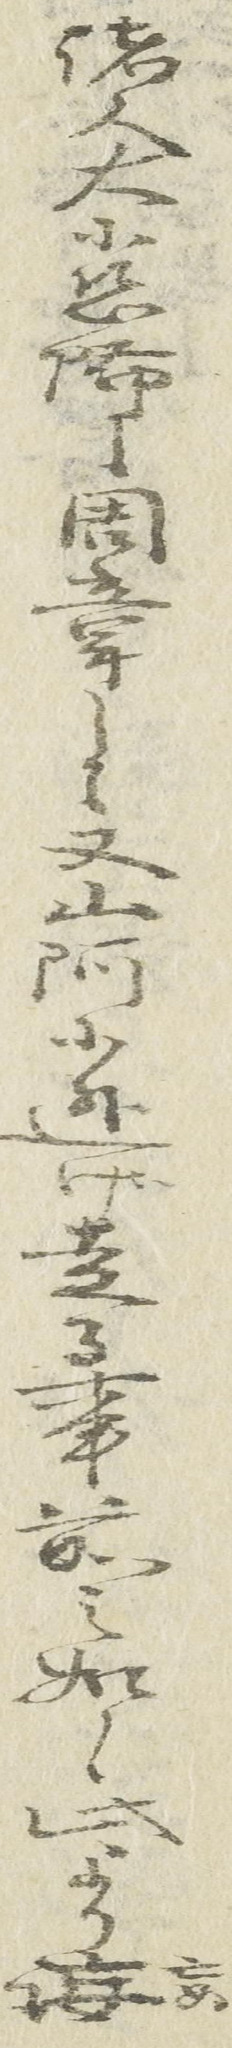諸人大に恐怖し周章して又山河に逃げ走る事前之如し此より妄
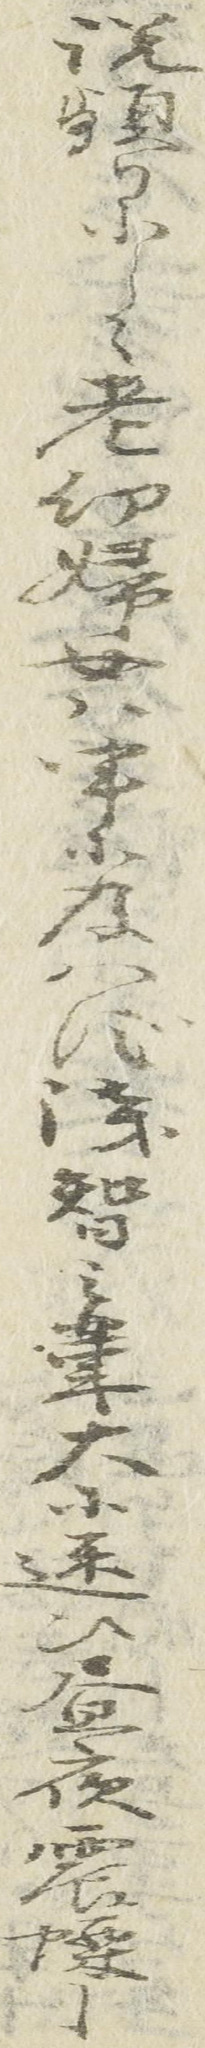説頻りにして老幼婦女は申に及はず浅智之輩大に迷ひ昼夜震慄し
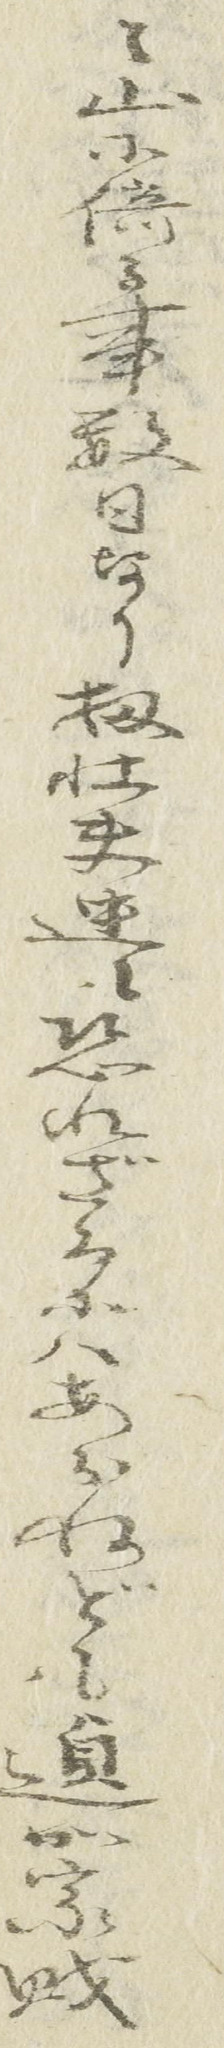て山に停る事数日なり扨壮夫迚も恐れざるにはあらねども遉か家財
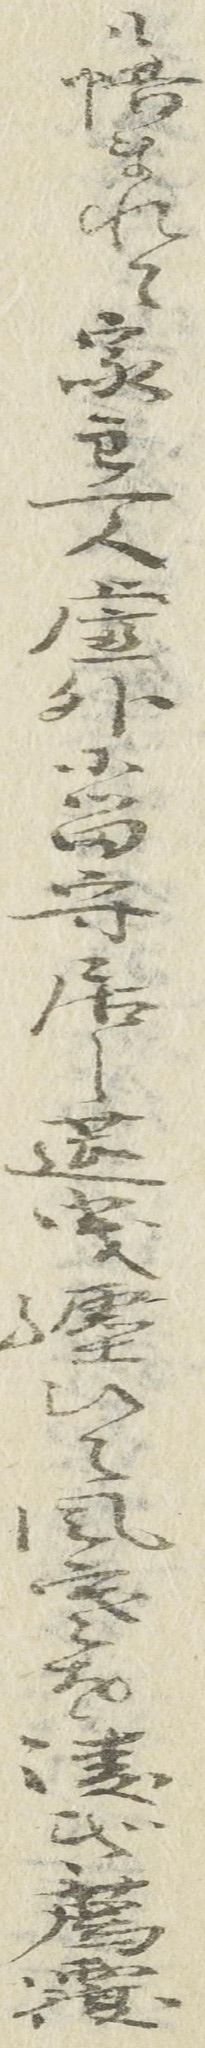も惜まれて家主一人廬外に留守居し莚曳纏ひて風寒を凌ぎ薦覆
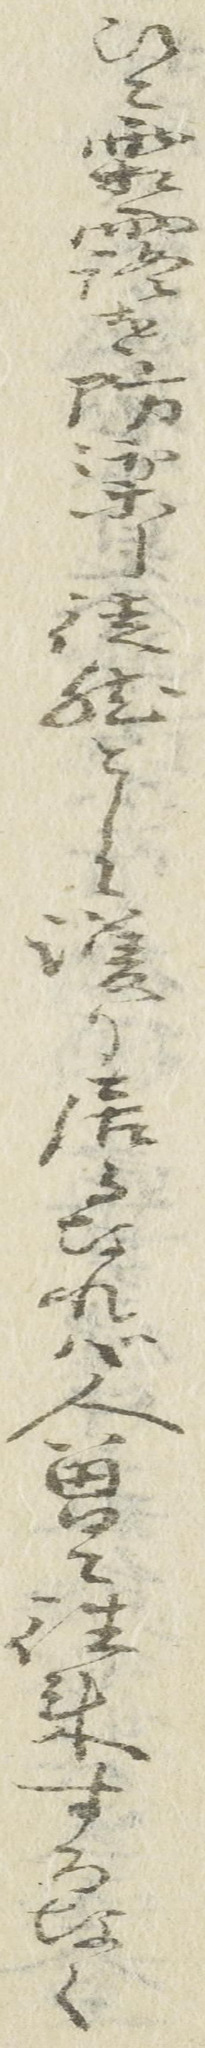ひて霜露を防禦し徒然として護り居るなれば人曽て往来するなく
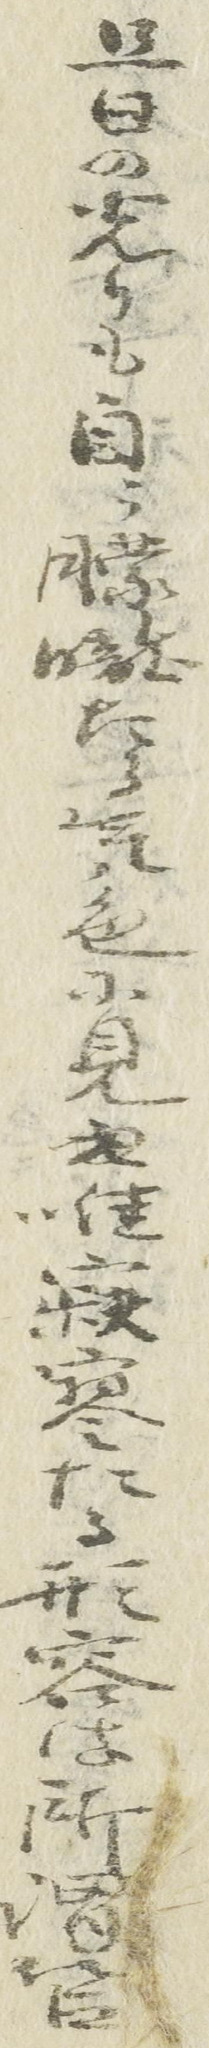旦日の光りも自ら朦朧たる気色に見え唯寂寥たる形容は所謂苫
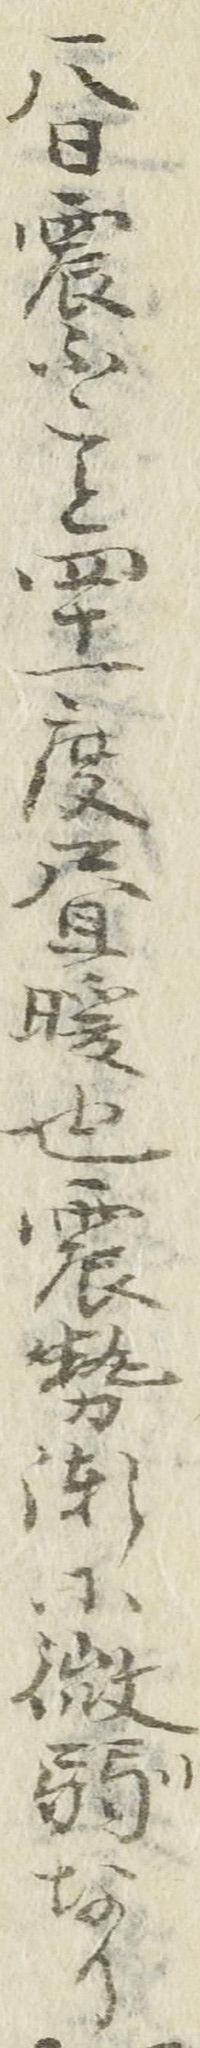一八日震ふこと四十一度昼暖也震勢漸に微弱なり
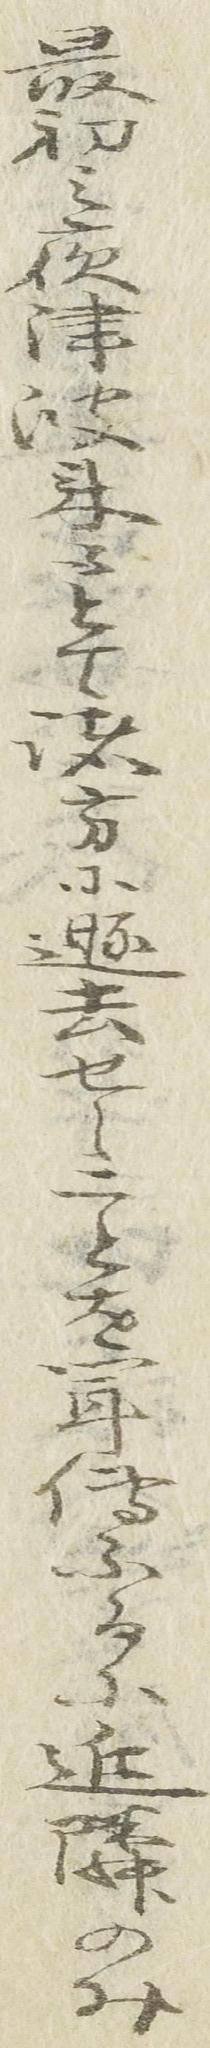最初之夜津波来るとて諸方に逃去せしことを聞伝ふるに近隣のみ
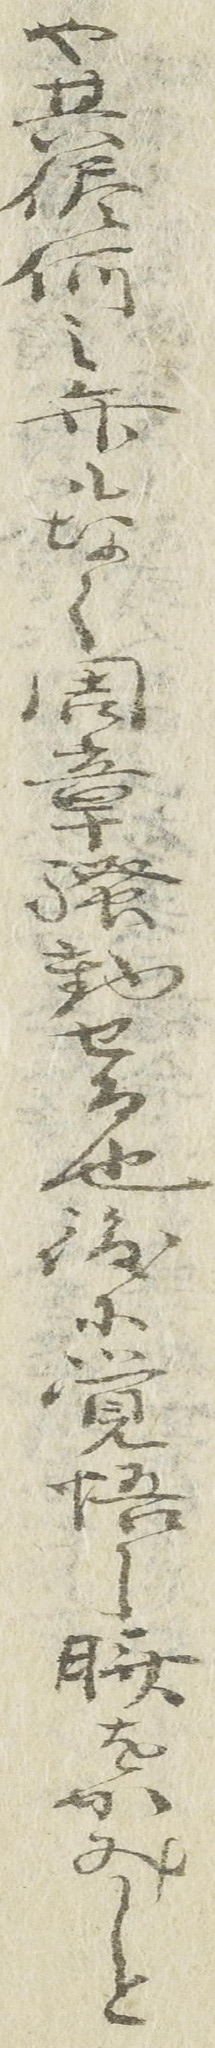や其儘何の弁もなく周章騒動せる也後に覚悟し臍をかみしと
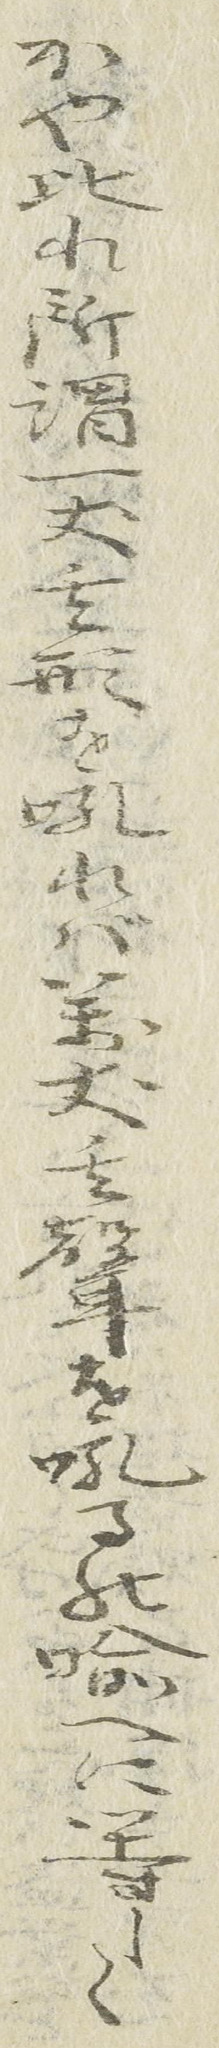かや此れ所謂一丈其形を吼れば万丈其声を吼るの喩へに等しく
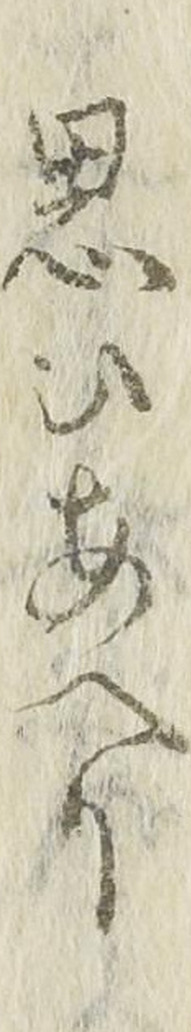思ひあへり
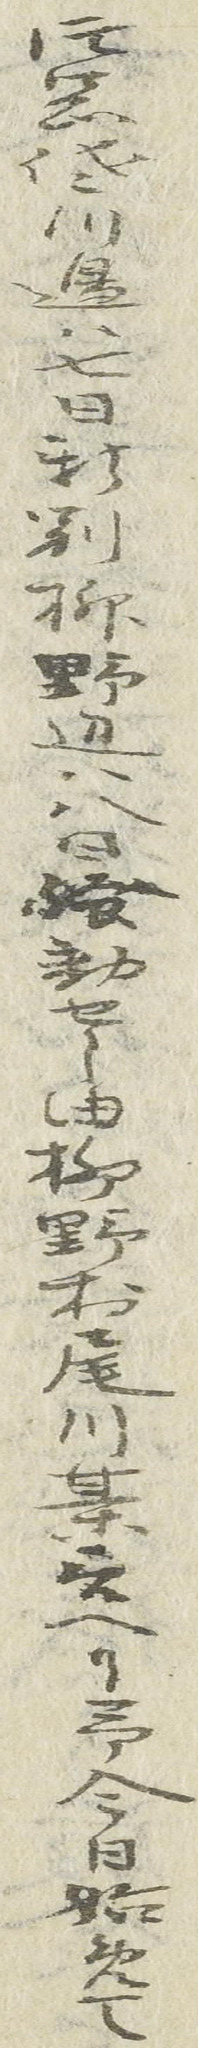片岡佐川辺は七日新別柳野辺は八日掻動せし由柳野村尾川某云へり予今日始めて
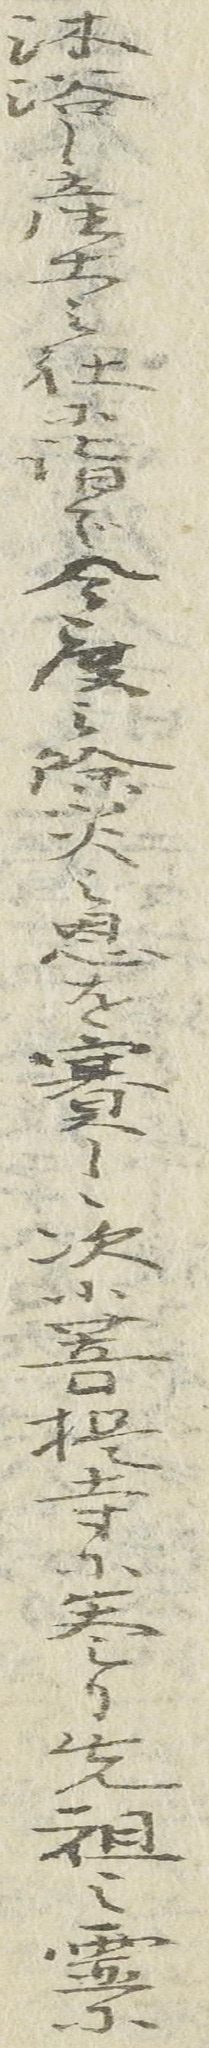沐浴し産土之社に詣で今度之除災之恩を賽し次に菩提寺に参り先祖の霊に
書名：地震前兆集　全
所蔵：東京大学地震研究所図書室 Earthquake Research Institute Library, The University of Tokyo, JAPAN
